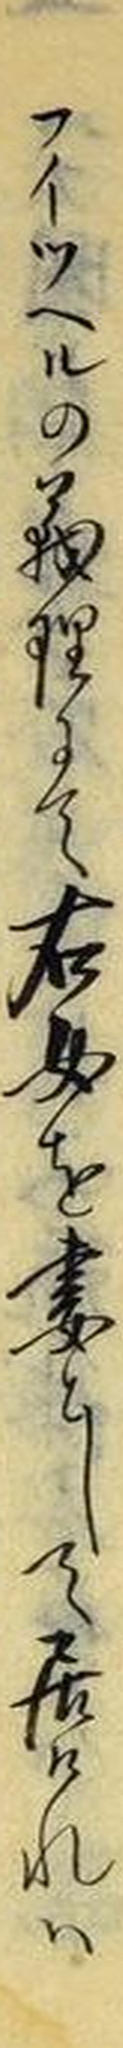フイツヘルの義理にて右女を妻として居けれハ
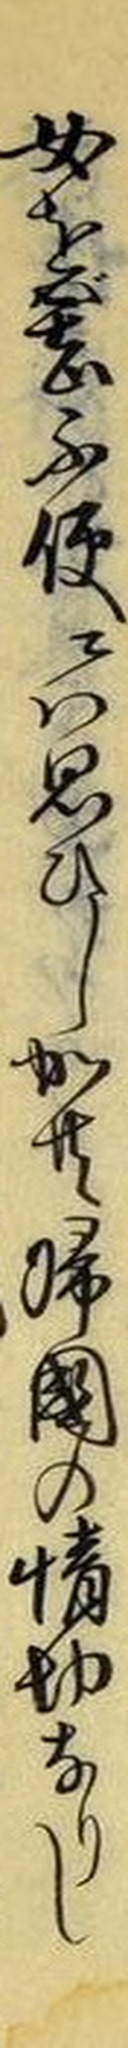女をバ甚不便ニハ思ひしが共帰国の情切なりし
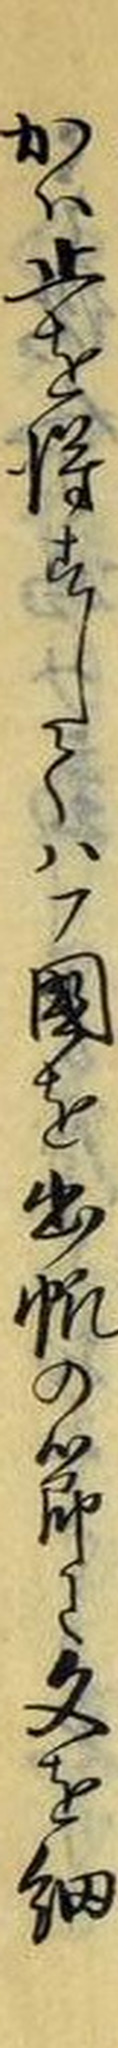かハ止を得すしてハフ国を出帆の節に文を細

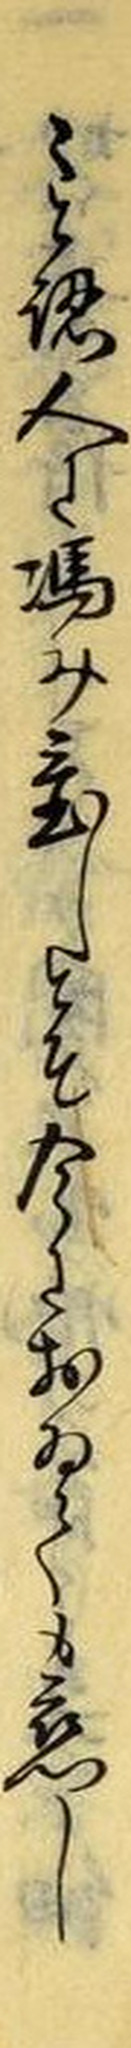々と認人に馮み置しとそ今におゐても恋し
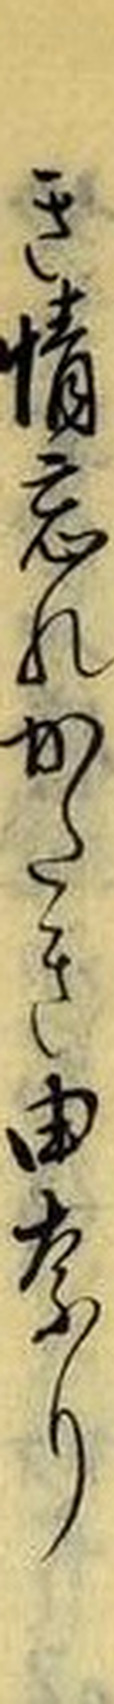き情忘れかたき由なり
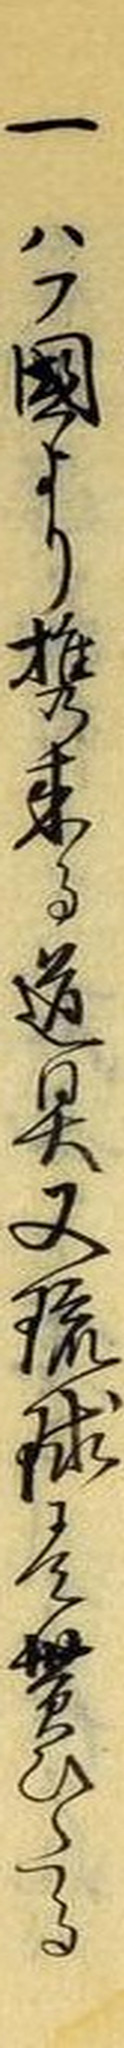一ハフ国より携来る道具又琉球にて貰ひたる
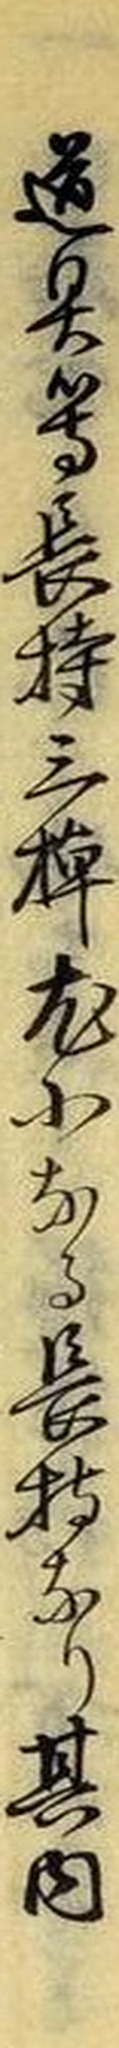道具等長持三棹尤小なる長持なり其内
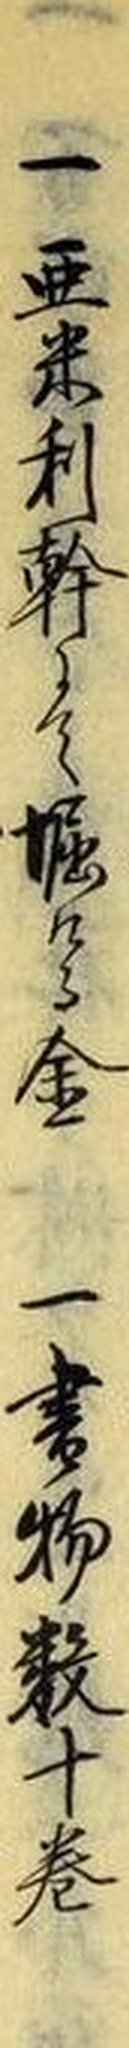一亜米利幹にて掘ける金一書物数十巻
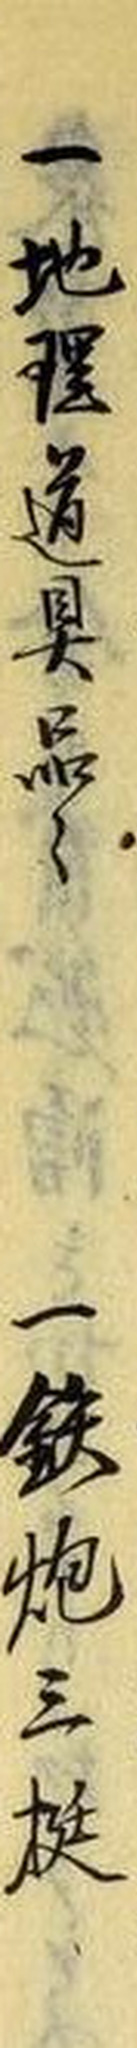一地理道具品々一鉄砲三挺
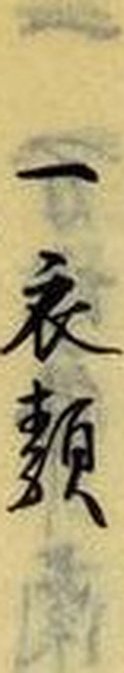一衣類
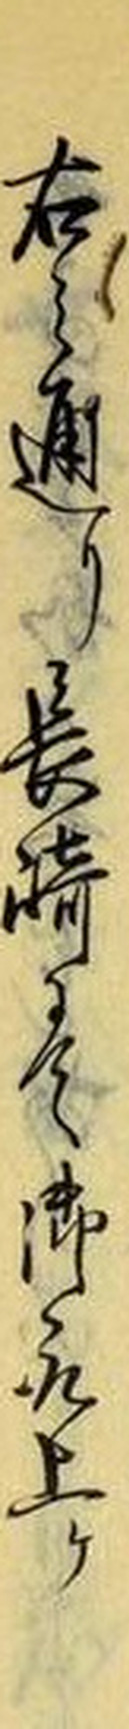右之長崎にて御取上ヶ
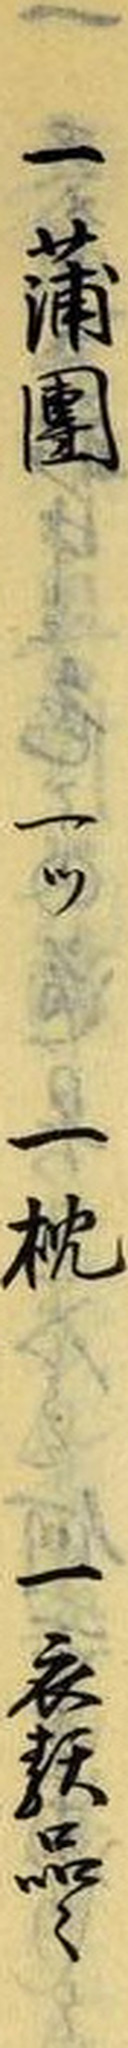一蒲団一ツ一枕一衣類品々
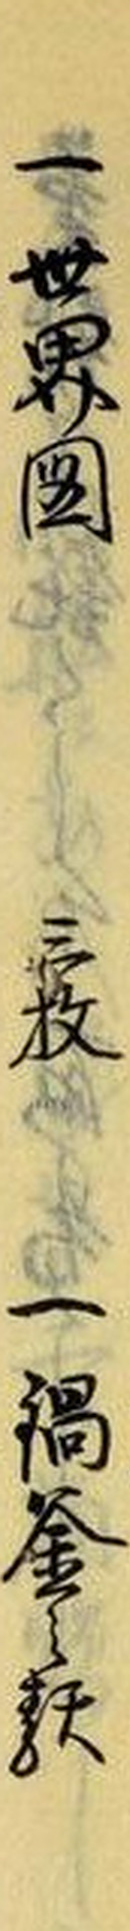一世界図三枚一鍋釜之類
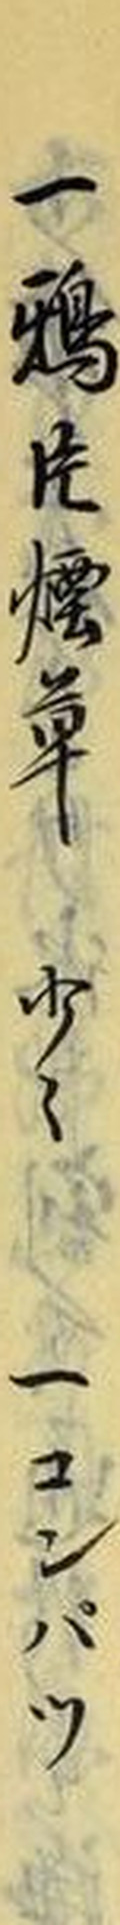一鴉片煙草少々一コンパツ
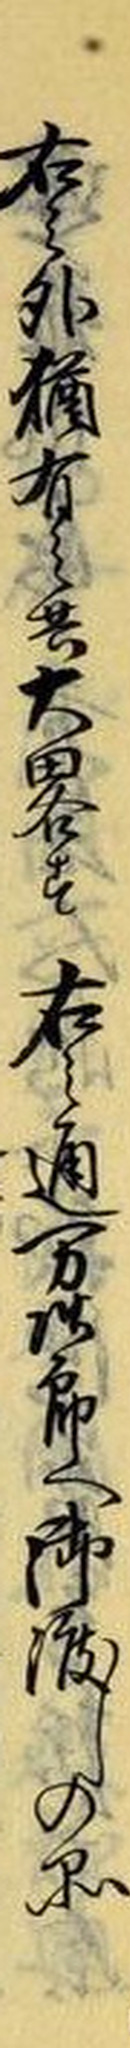右之外猶有之共大略は右之と通万次郎へ御渡しの品
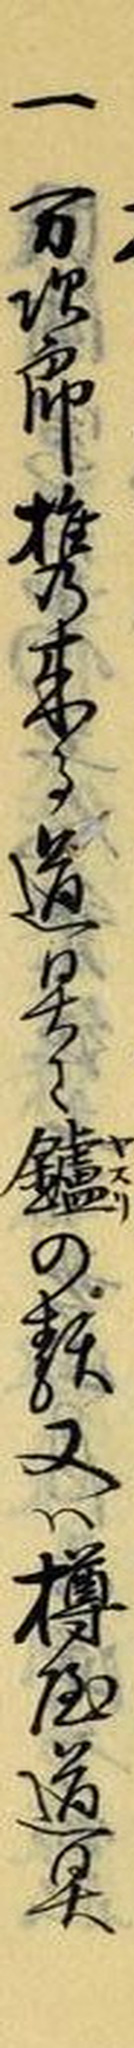一万次郎携来る道具に鑢の類又ハ樽屋道具
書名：漂客談奇（備考雑録写8）
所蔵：福井県文書館 Fukui Prefectural Archives
